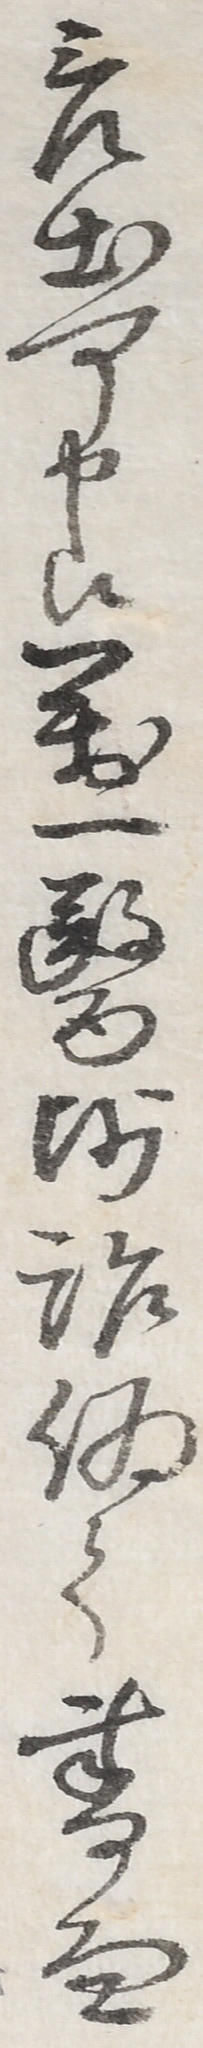差出可申候万一医師詐偽之書面
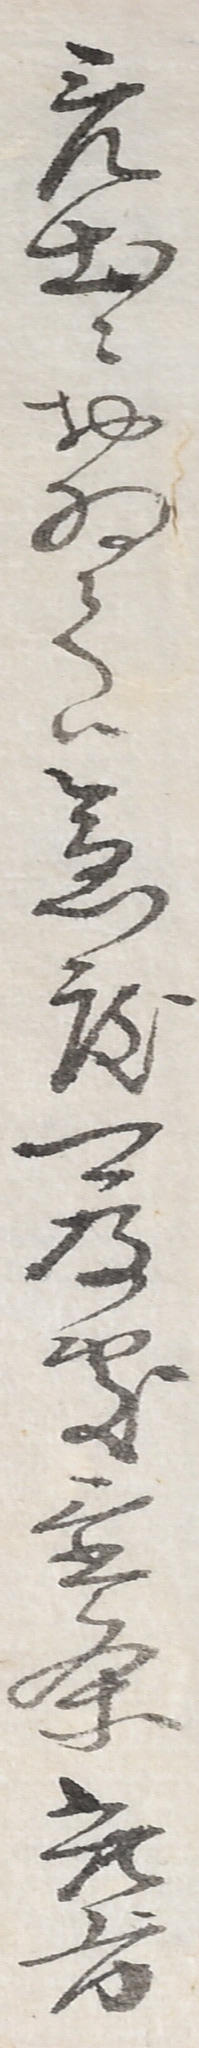差出におゐては急度可及処置条此旨
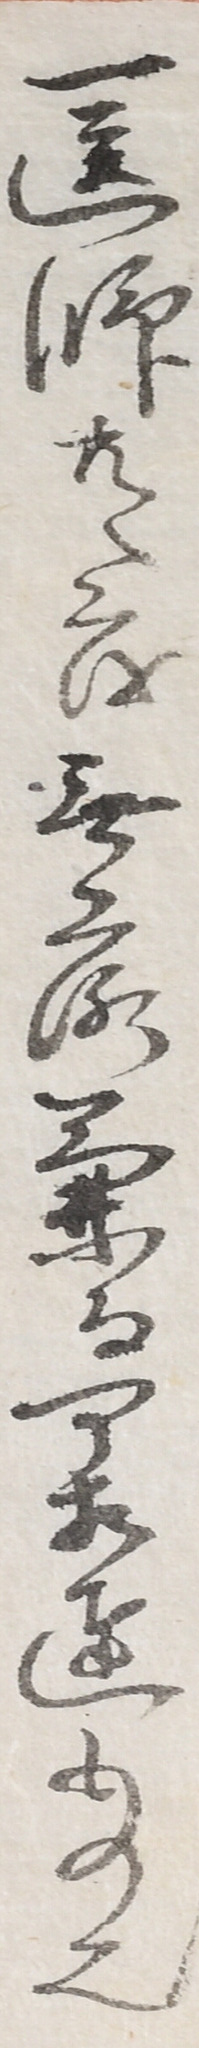医師共へも無落兼而可相達もの也
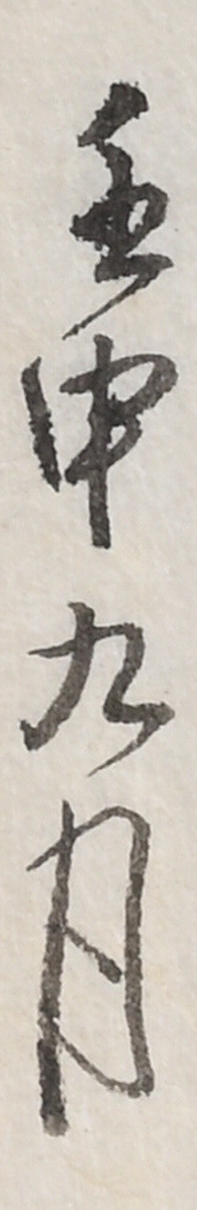壬申九月
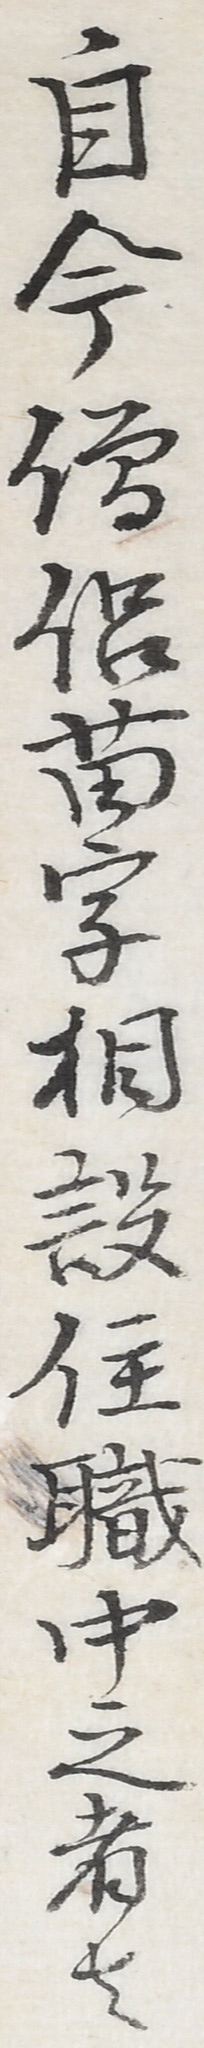自今僧侶苗字相設住職中之者は
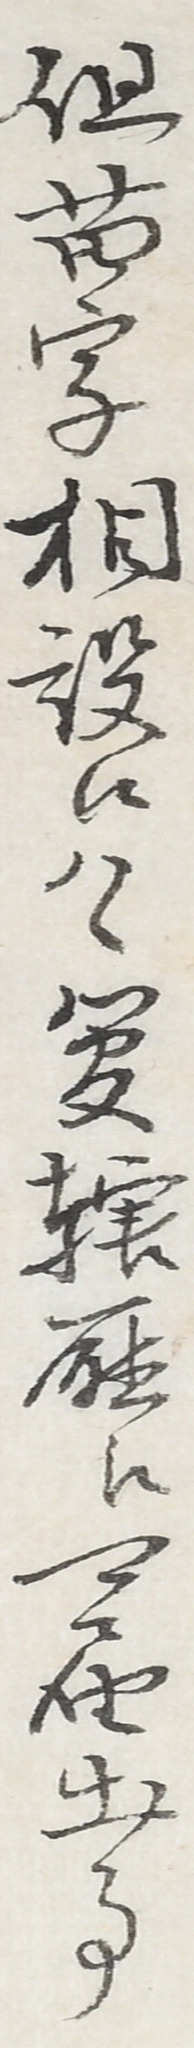但苗字相設候はゝ管轄庁え可届出事
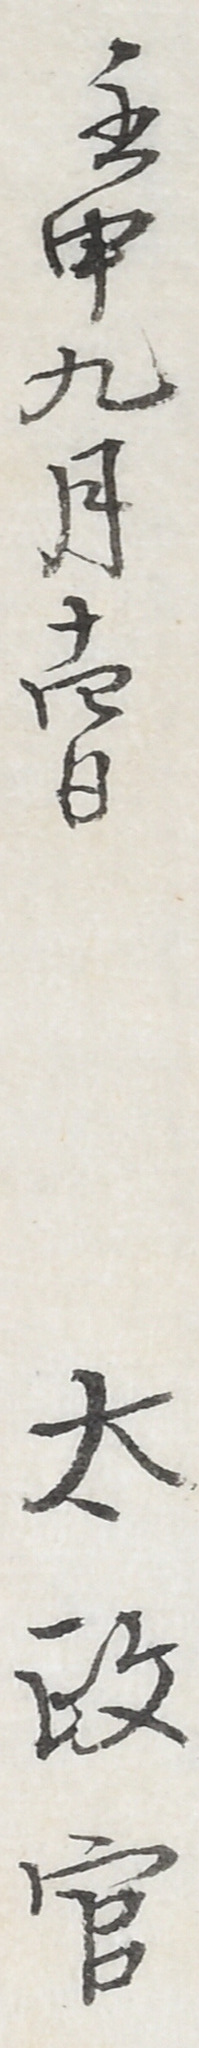壬申九月十四日太政官
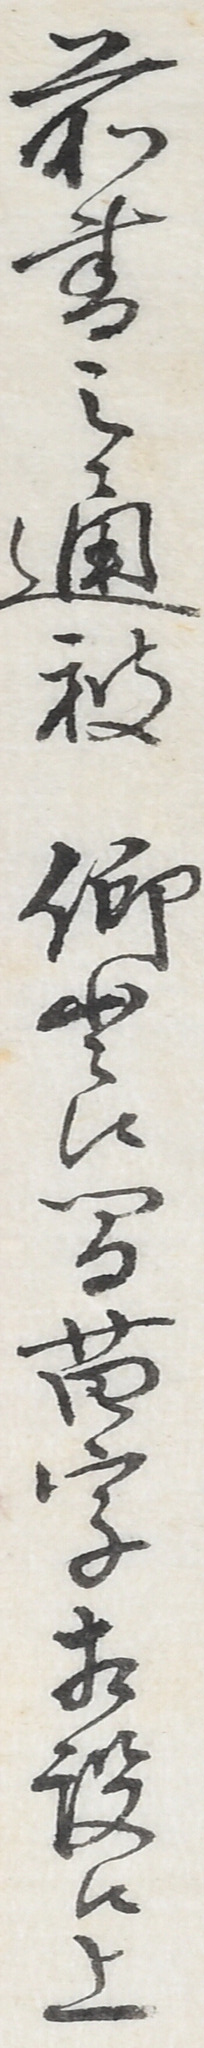前書之通被仰出候間苗字相設候上
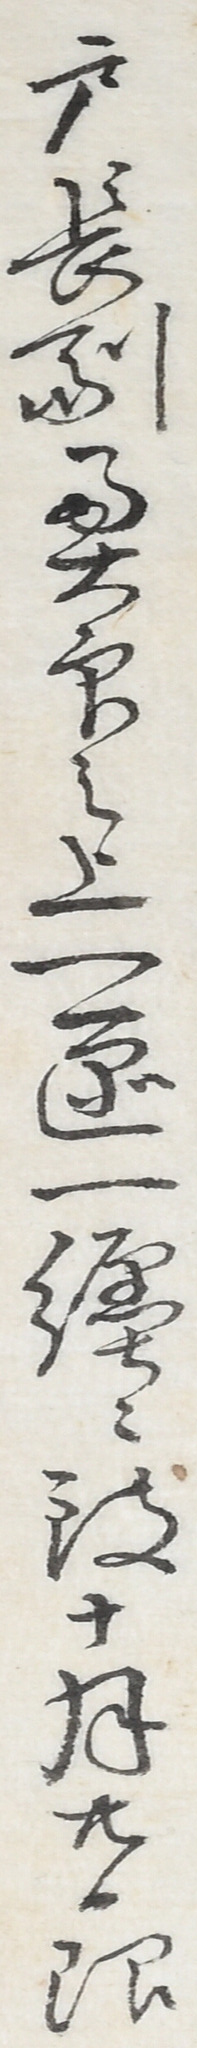戸長副奥印之上一区一纏に致十月廿日限
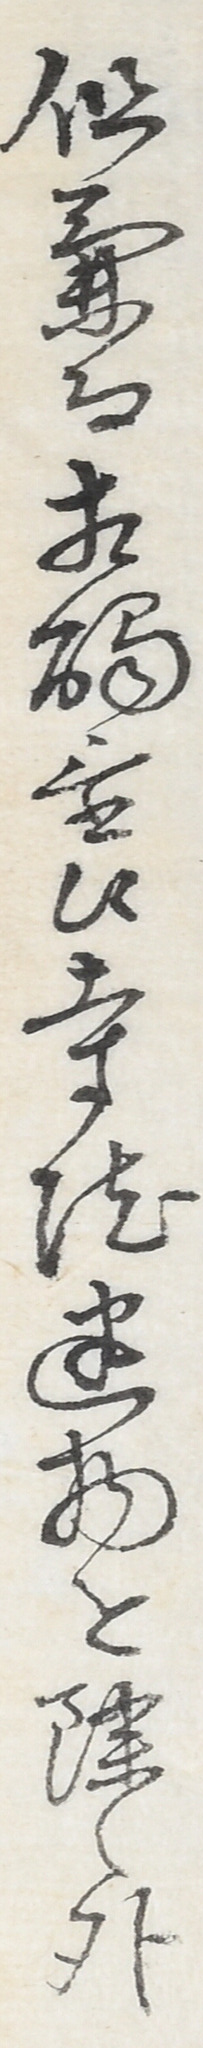但兼て相触置候寺院建物を除之外

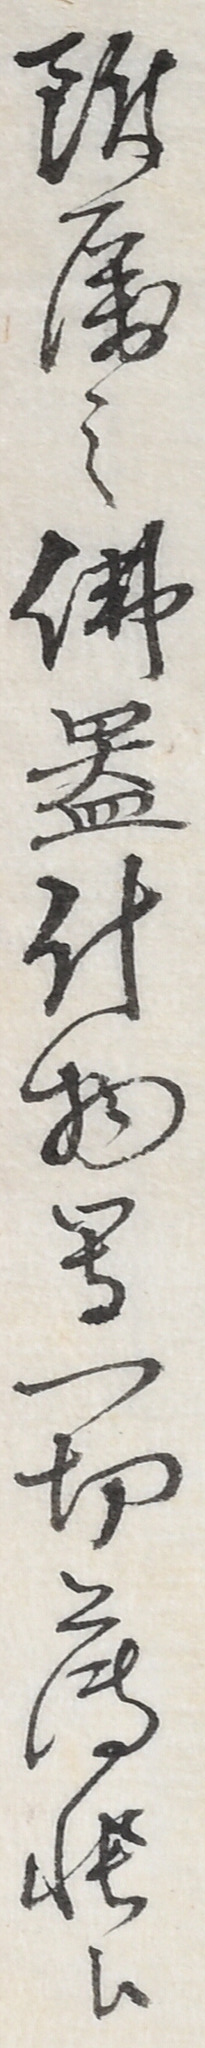附属之仏盎什物等一切簿帳え
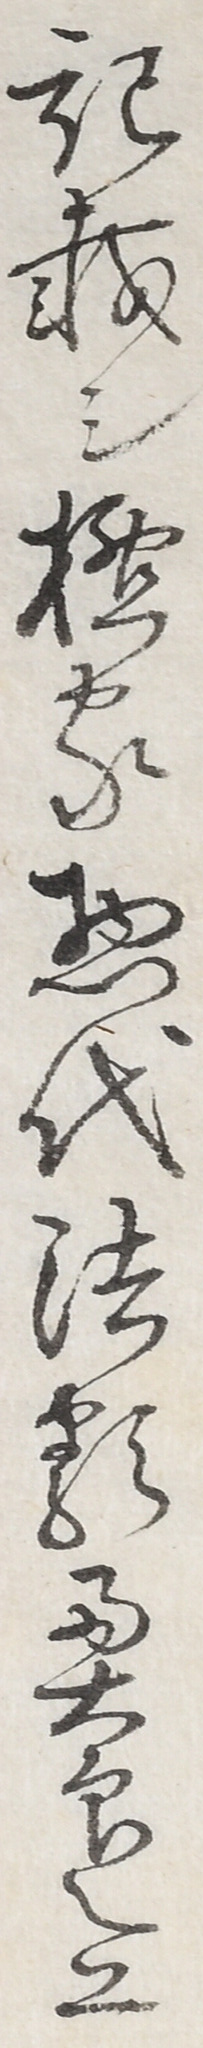記載シ檀家惣代法類奥印之上
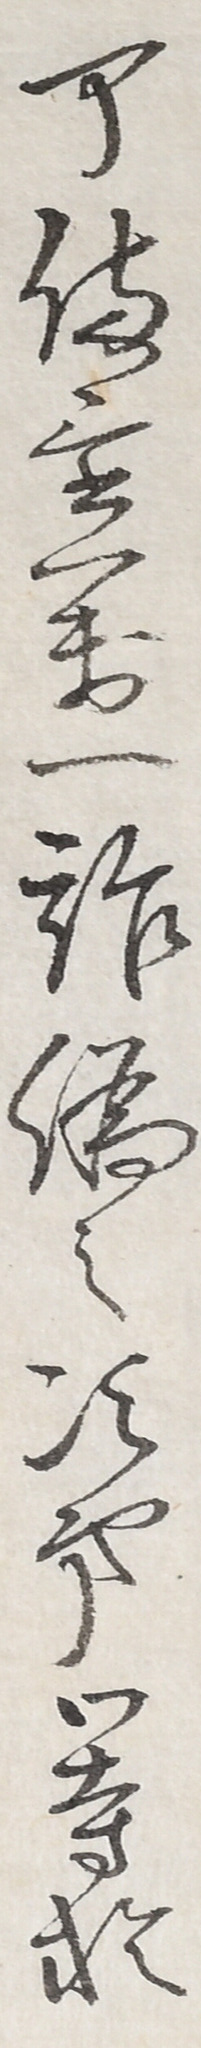可備置万一詐偽之次第等於
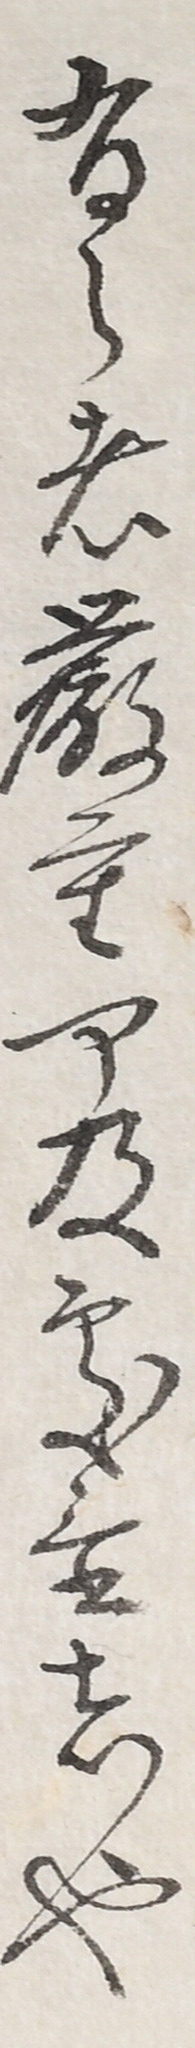有之者厳重可及処置者也
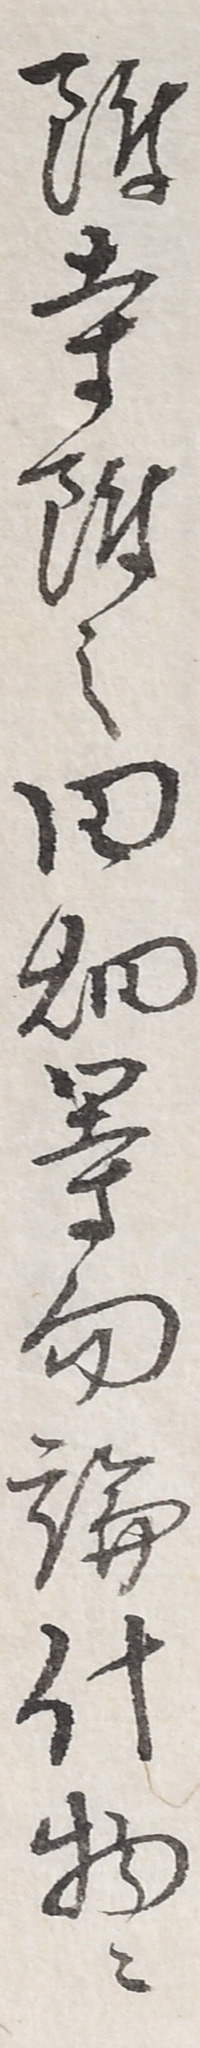附寺附之田畑等勿論什物ニ
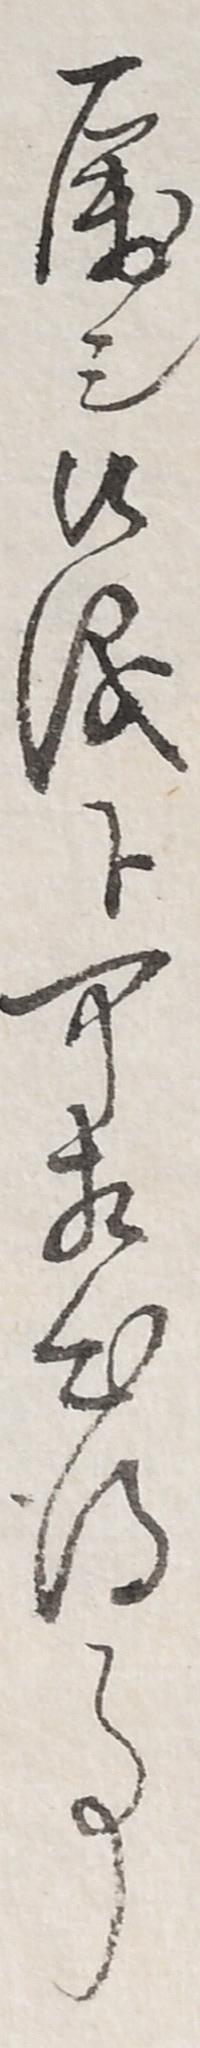属シ候儀ト可相心得事
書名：壹番・御布告一式
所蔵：伊那市立高遠町図書館・合同会社AMANE
